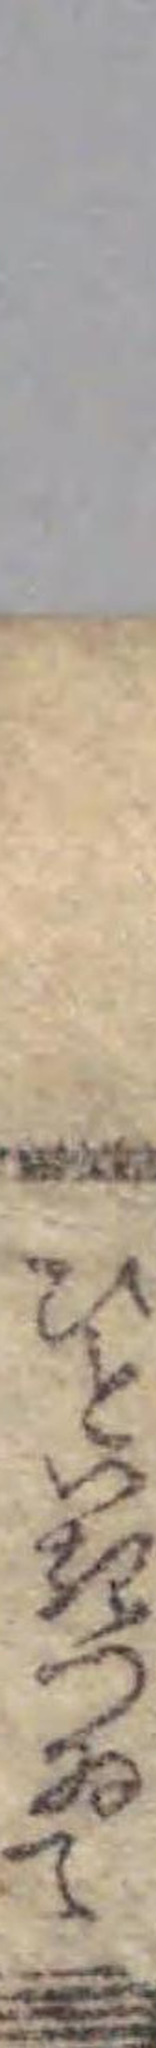ひといきつゐて
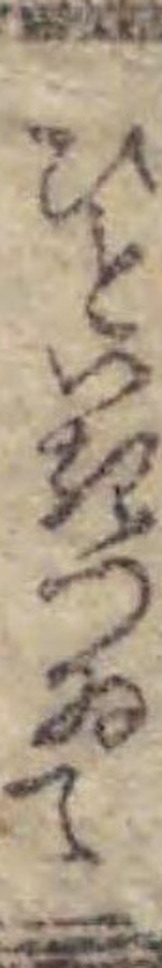ひといきつゐて
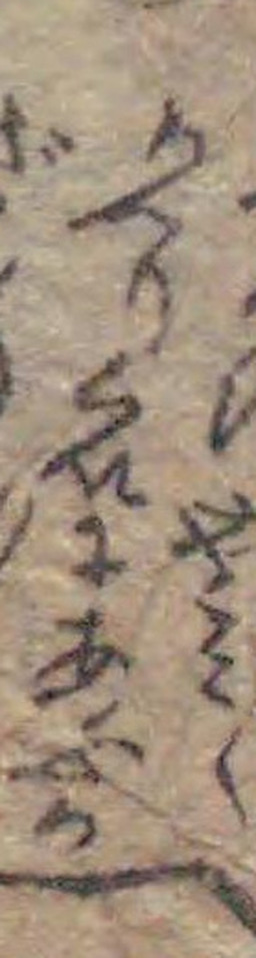かへりくいにあふか
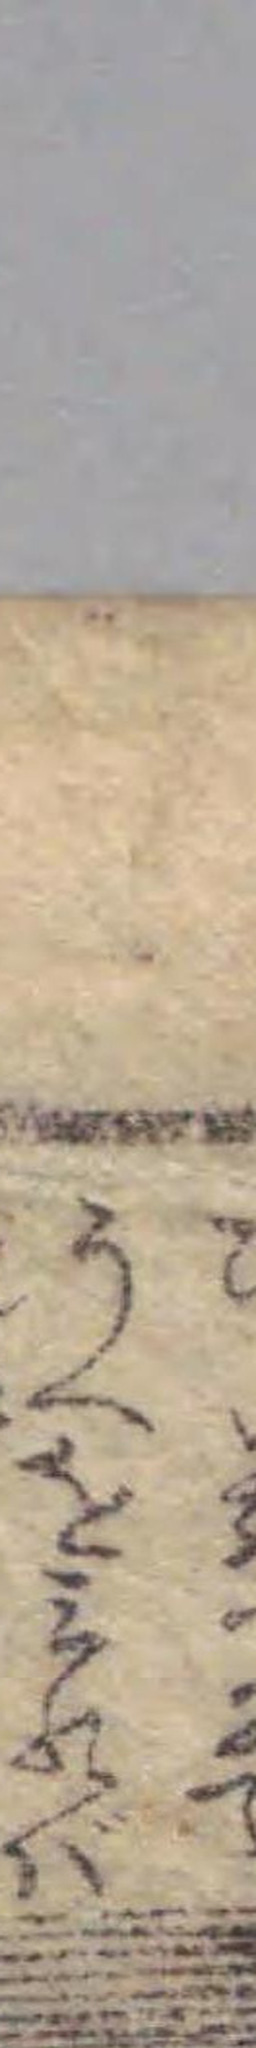うへをみれば
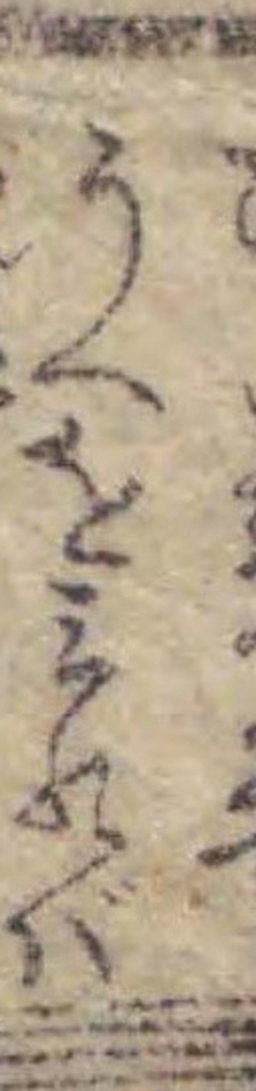うへをみれば
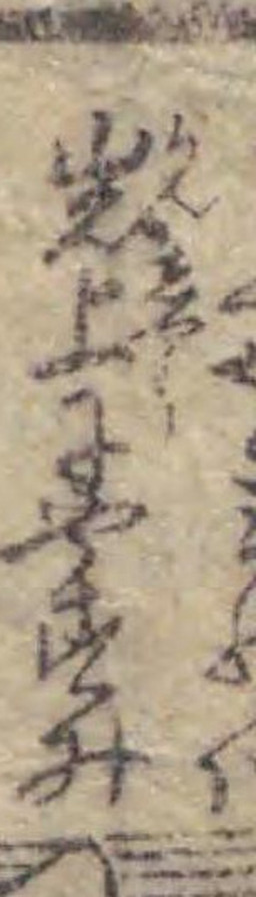岩上にやすみ
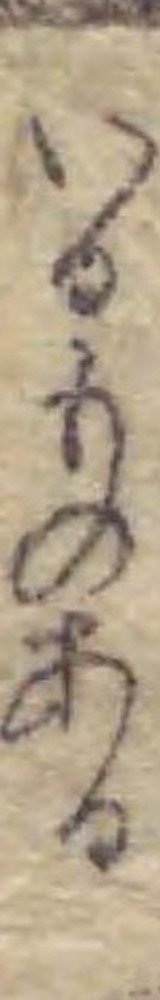いるものある
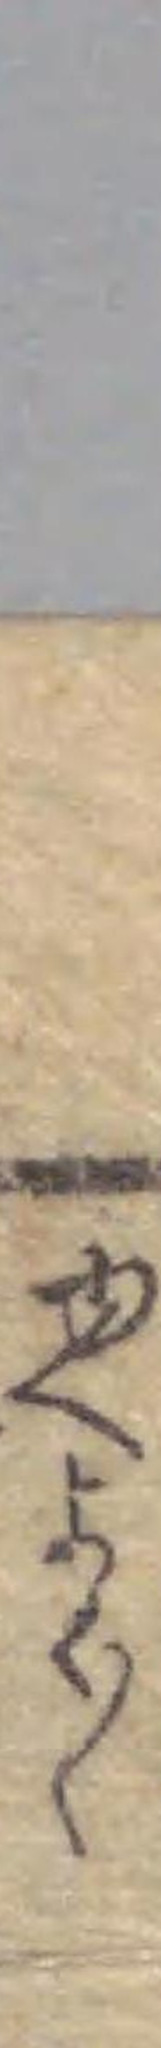ゆへよく〳〵
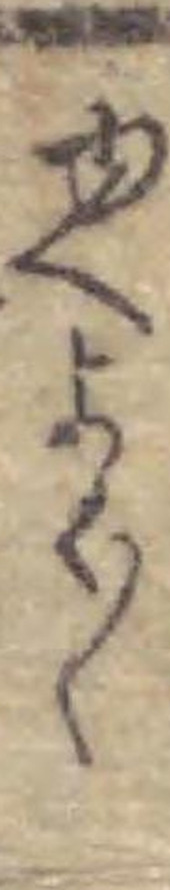ゆへよく〳〵
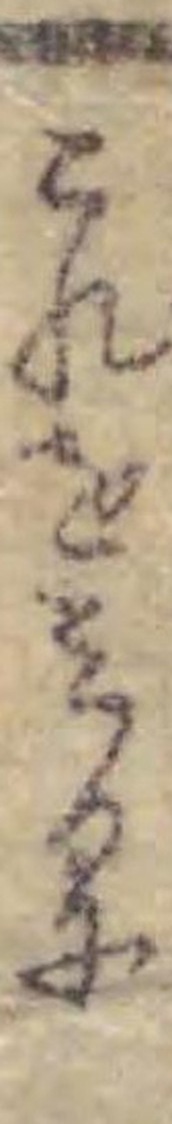これをみるに
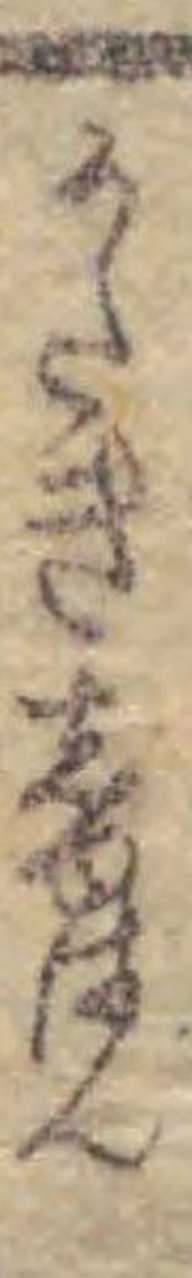かたきしゆはん
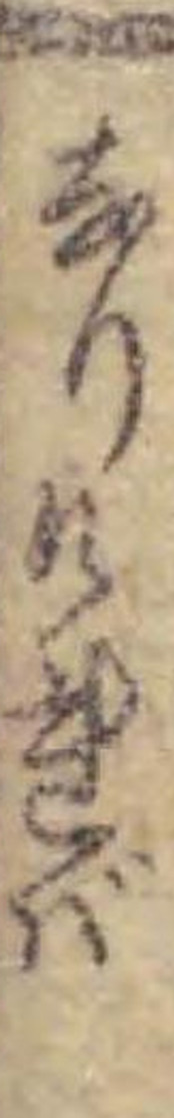なりければ
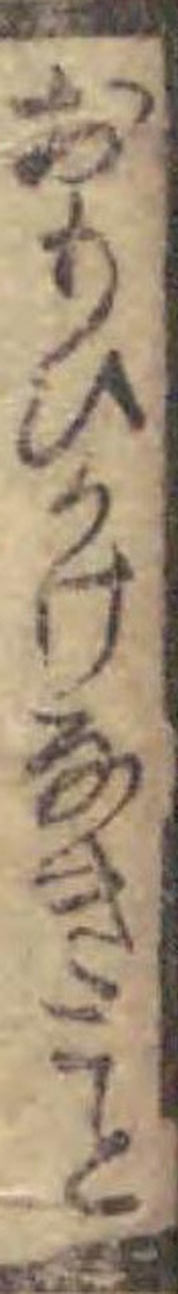おもひかけなきこと
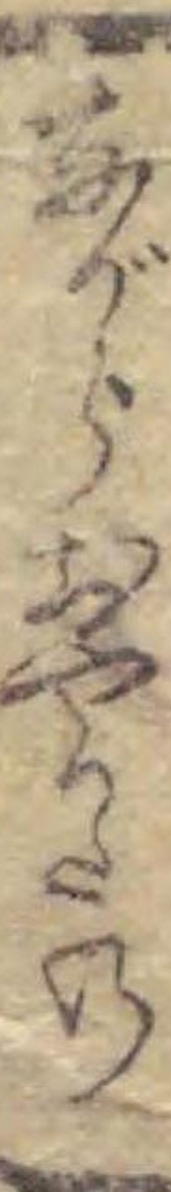ながらおやかたの
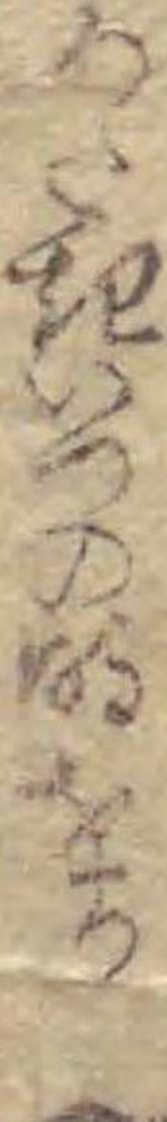かたきいつの時をり
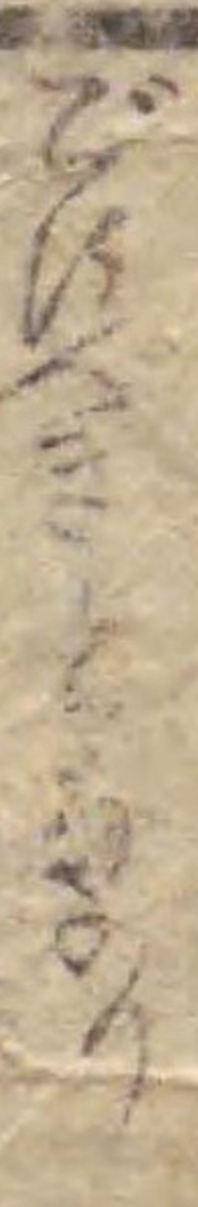ですべきとなのり
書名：化物世界夜半嵐 : 3巻
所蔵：国立国会図書館 National Diet Library, JAPAN
